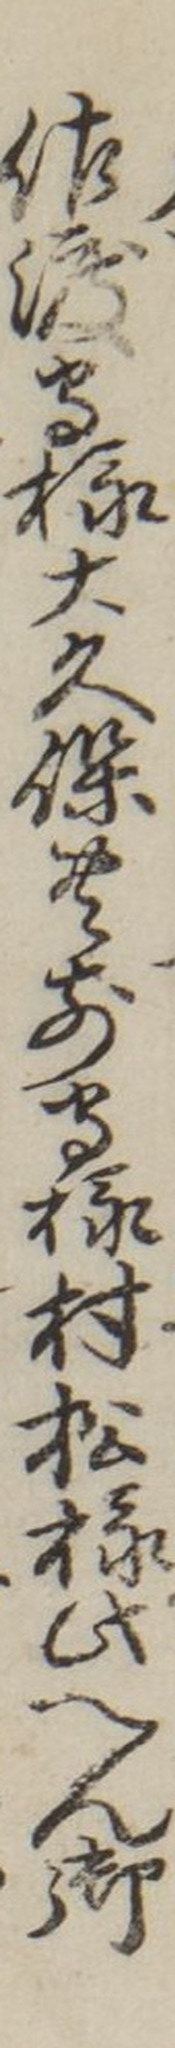佐渡守様大久保豊前守様村松様此へん御
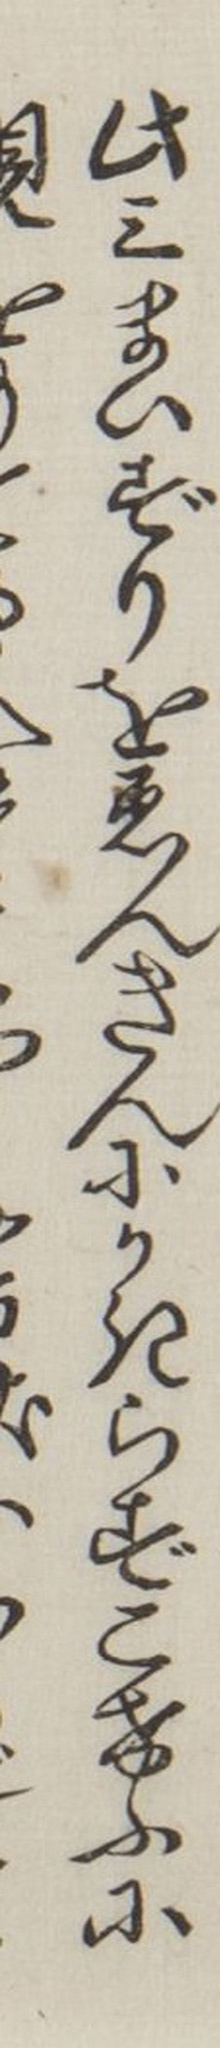此三まいずりをゑんきんにかきらずこけふに
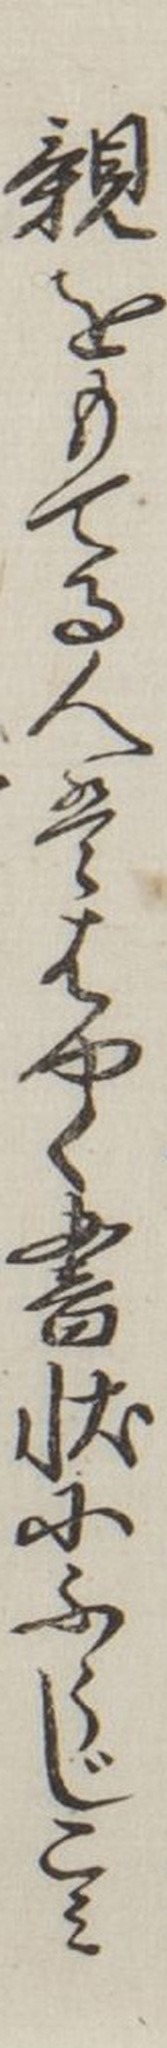親をもてる人ははやく書状にふうじこみ
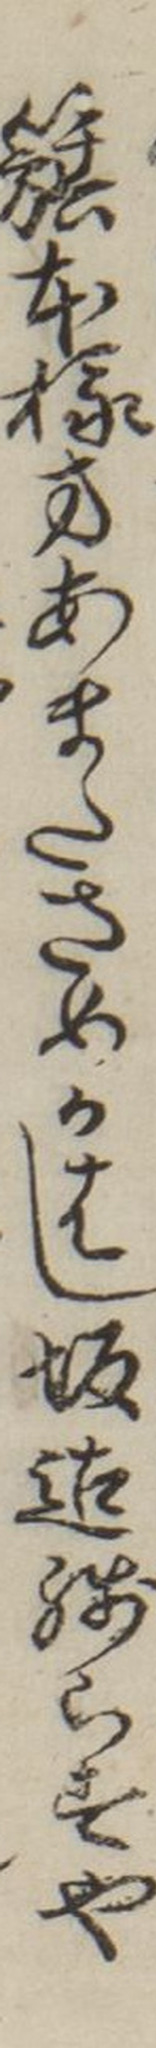簱本様方あまたさめかはし坂迄残らすや
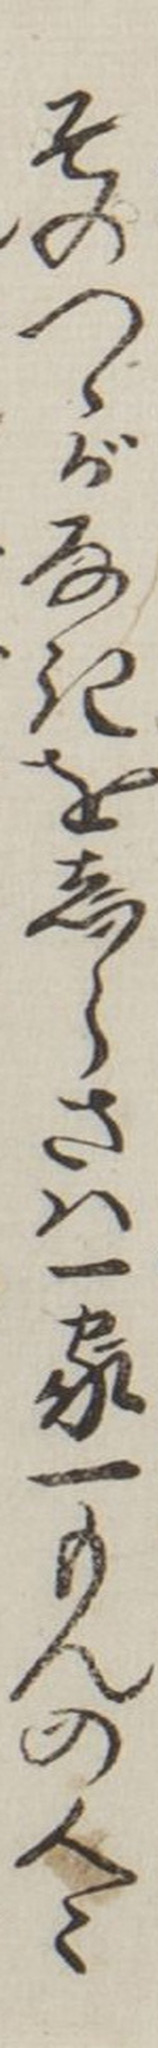そのつゝがなきをしらさは一家一もんの人々
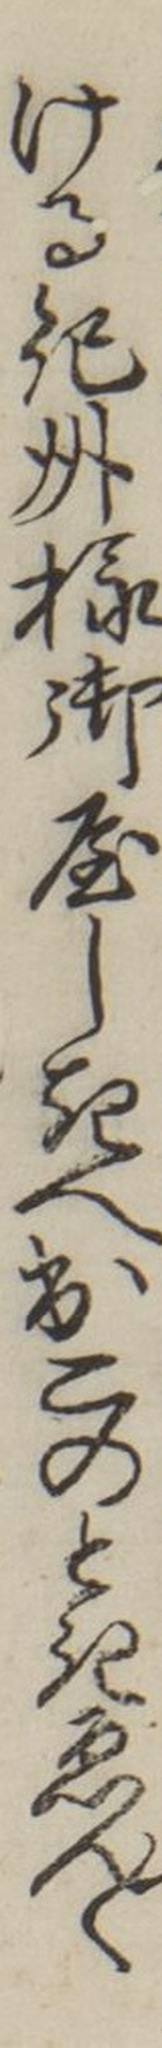ける紀州様御屋しきへ出このときゑん〳〵
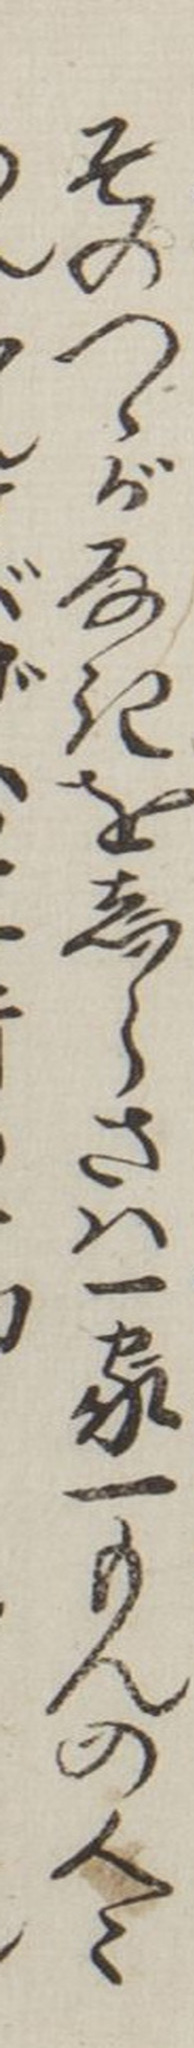そのつゝがなきをしらさは一家一もんの人々
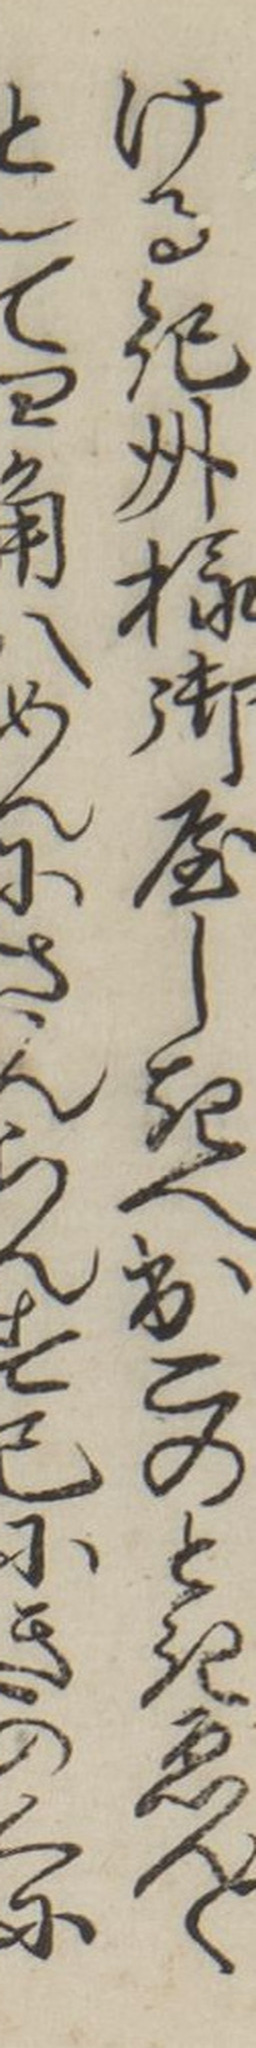として四角八めんにさんらんす已にきのくに
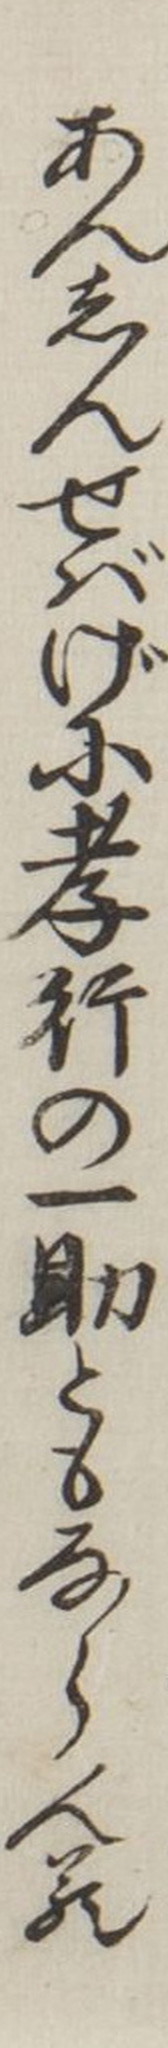あんしんせばげに孝行の一助ともならんか
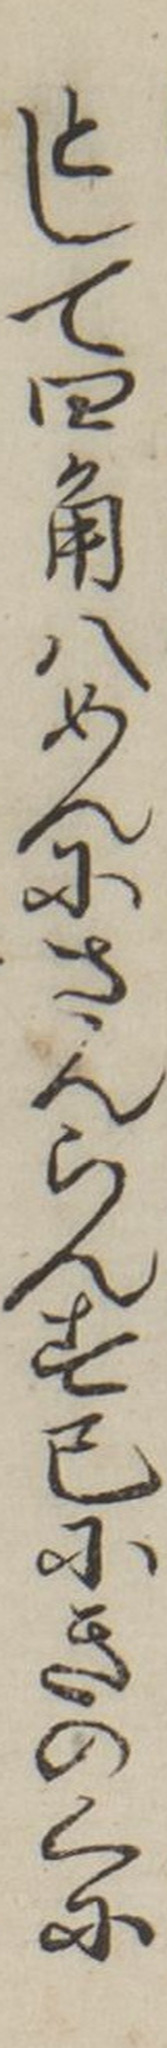として四角八めんにさんらんす已にきのくに
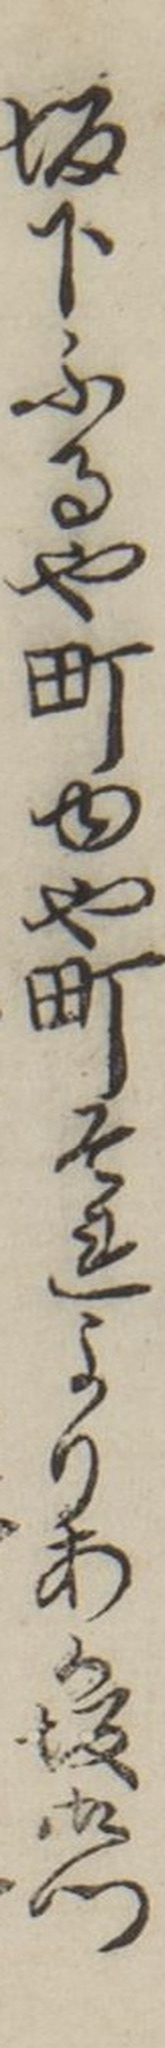坂下ふるや町ゆや町それよりあか坂御門
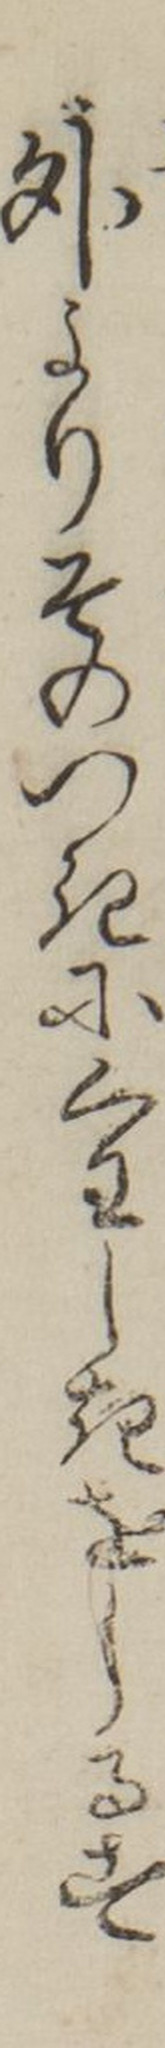外よりそのつきにくわしきをしるす
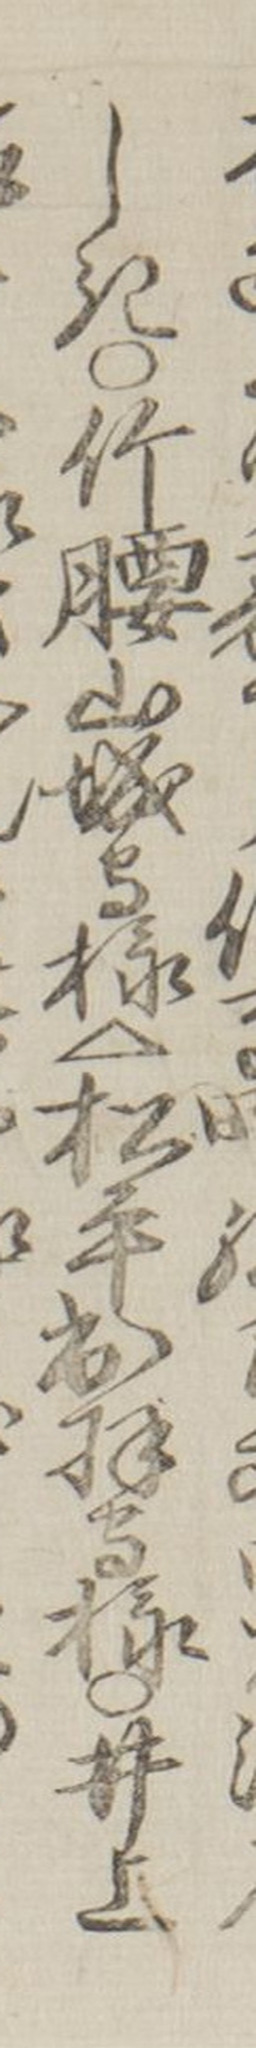しき○竹腰山城守様△松平出羽守様○井上
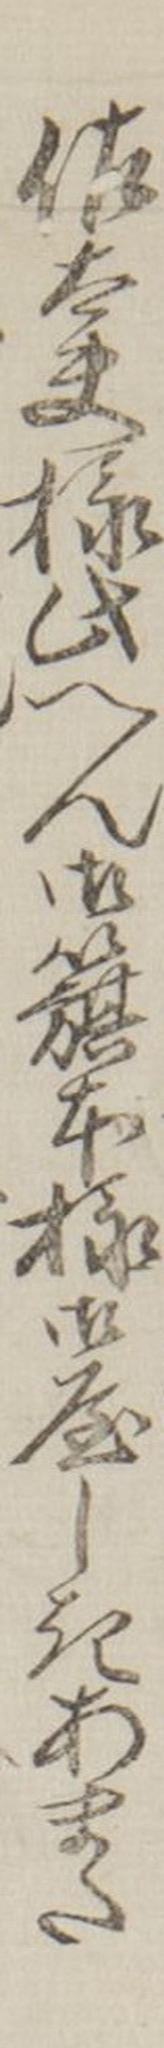佐太夫様此へん御簱本様御屋しきあまた
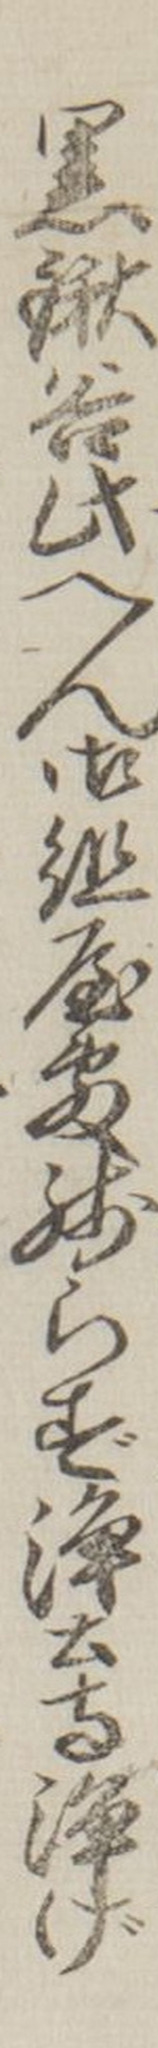黒鍬谷此へん御組屋敷残らず浄土寺浄げ
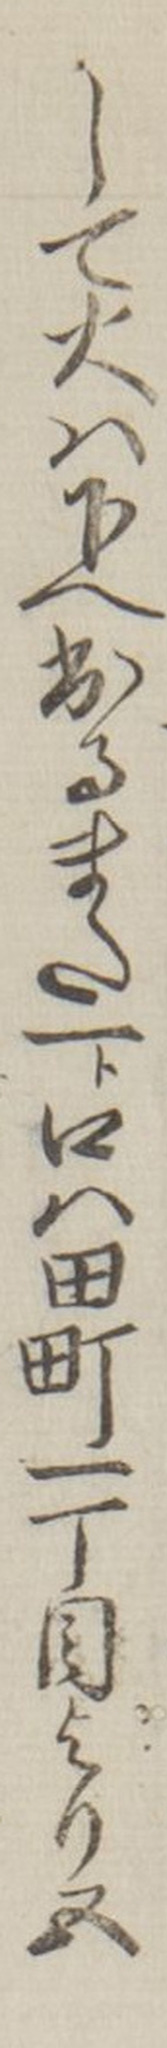して火は下へ出るまた一ト口八田町一丁目より五
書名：るいせう道しるベ　上・中・下
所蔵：あいおいニッセイ同和損保株式会社
